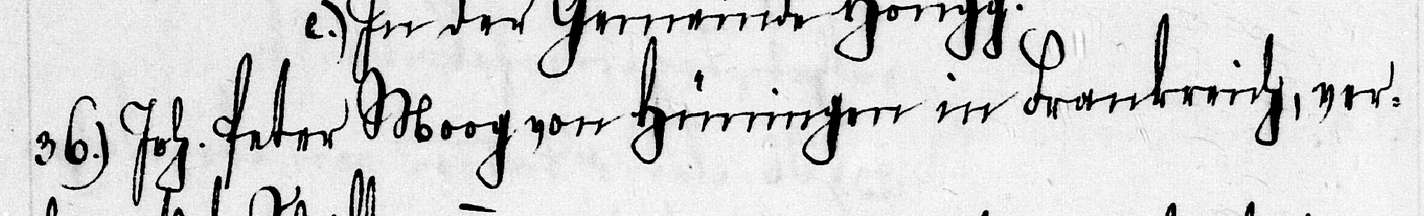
36.) Joh. Peter Moog von Hüningen in Frankreich, ver¬
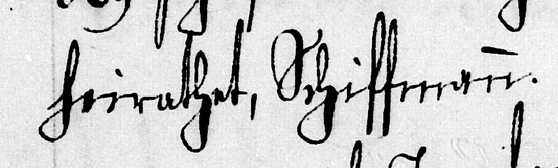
heirathet, Schiffman¬
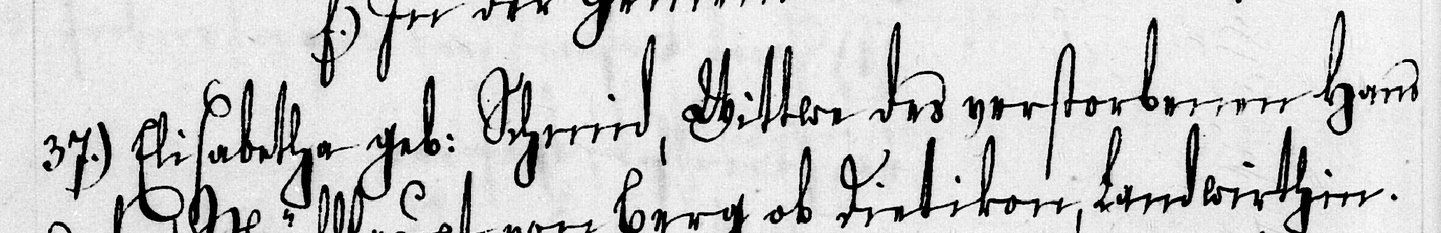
37.) Elisabetha geb: Schmid, Wittwe des verstorbenen Hans
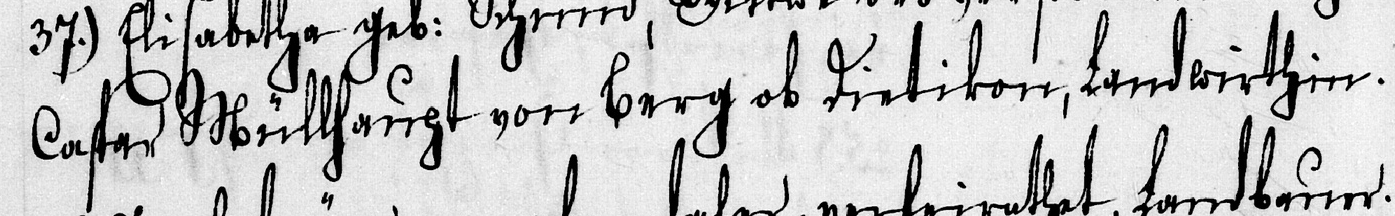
Caspar Müllhaupt von Berg ob Dietikon, Landwirthin.
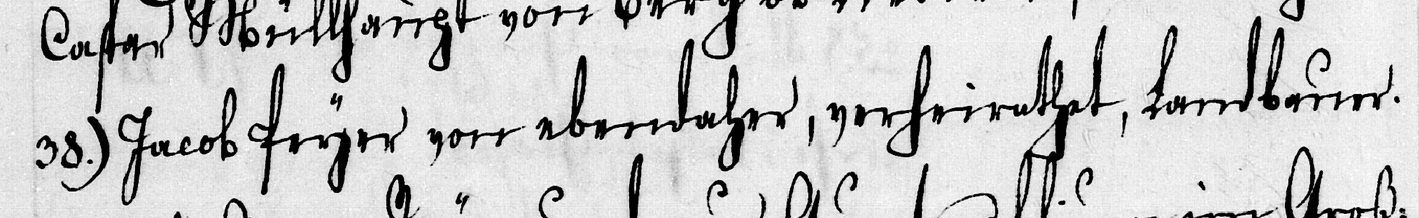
38.) Jacob Peyer von ebendaher, verheirathet, Landbauer.
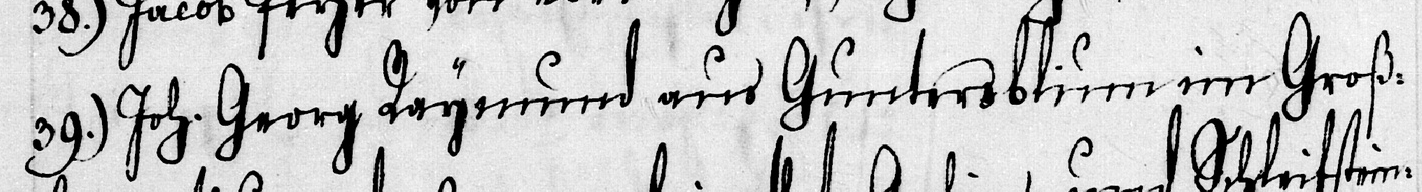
39.) Joh. Georg Raymund aus Guntersblum im Groß¬
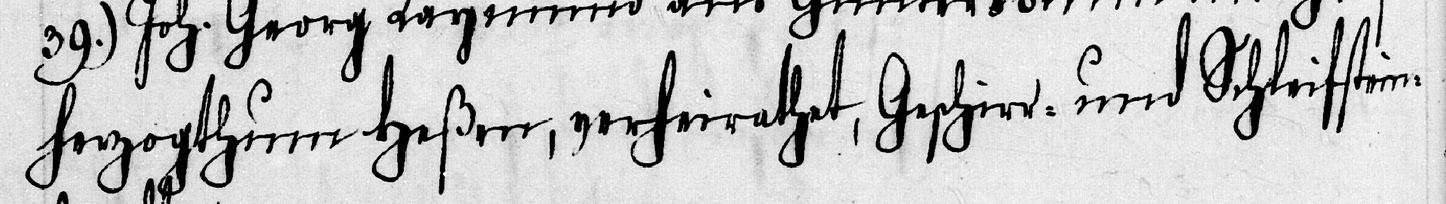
herzogthum Heßen, verheirathet, Geschirr- und Schlei¬
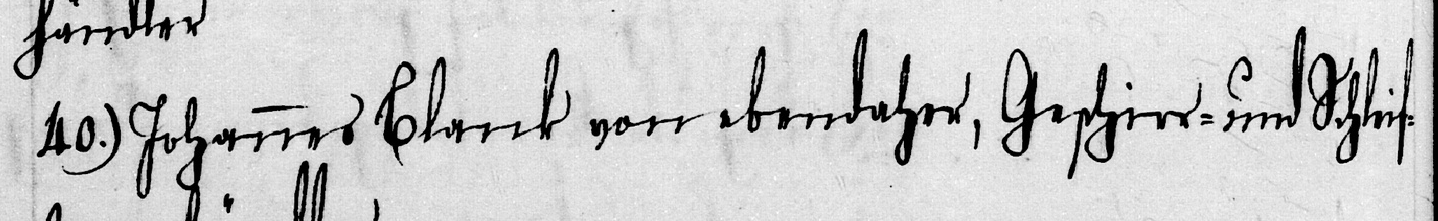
40.) Johannes Blank von ebendaher, Geschirr- und Schle¬
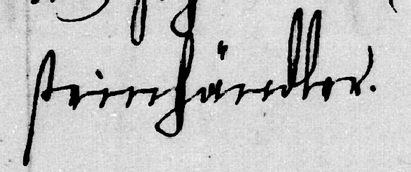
steinhändler.
